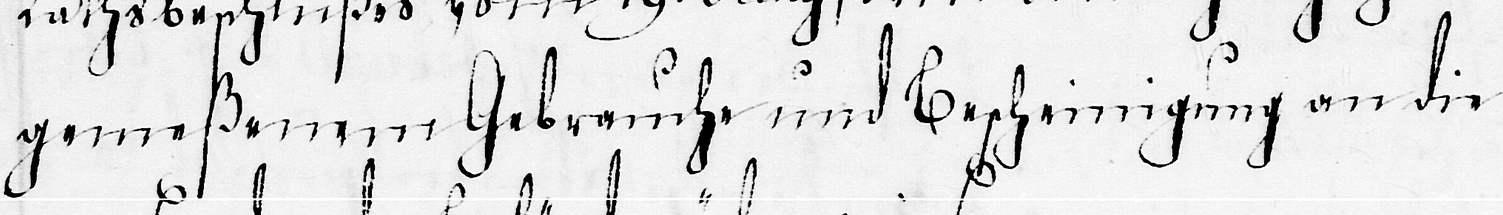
gemeßenem Gebrauche und Bescheinigung an die
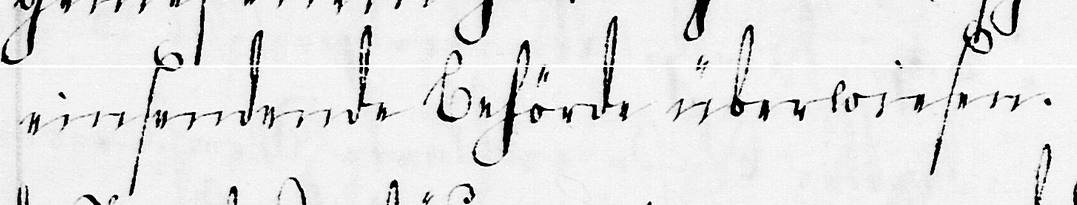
einsendende Behörde überwiesen.
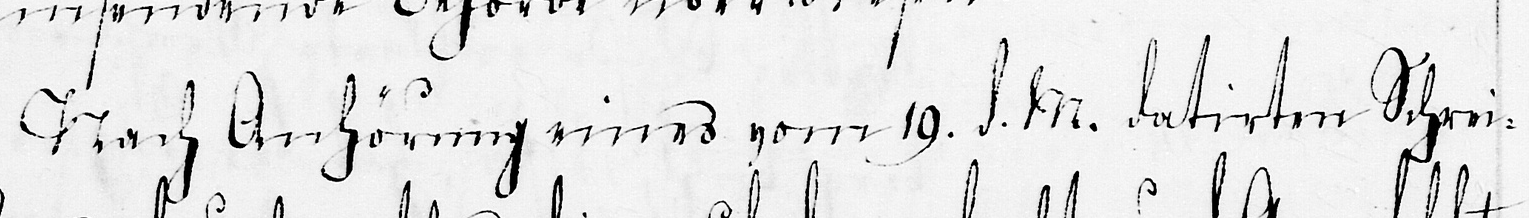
Nach Anhörung eines vom 19. d. M. datirten Schrei¬
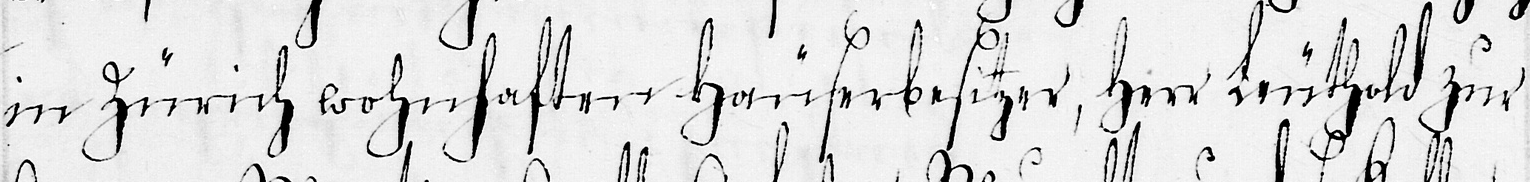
in Zürich wohnhaften Häuserbesitzer, Herr Leuthold zur
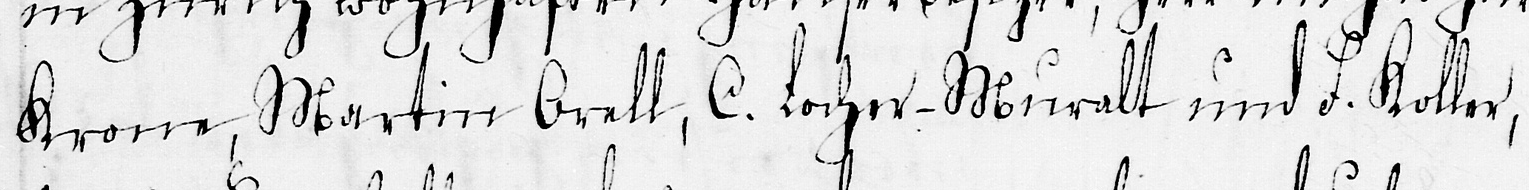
Krone, Martin Orell, C. Locher-Muralt und F. Koller,
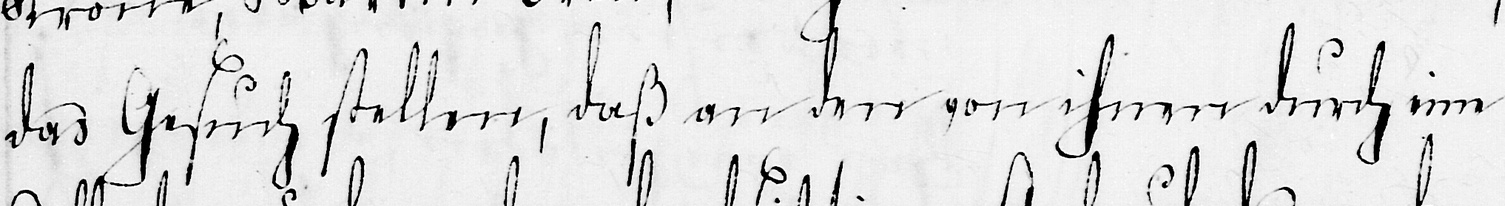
das Gesuch stellen, daß an den von ihnen durch eine
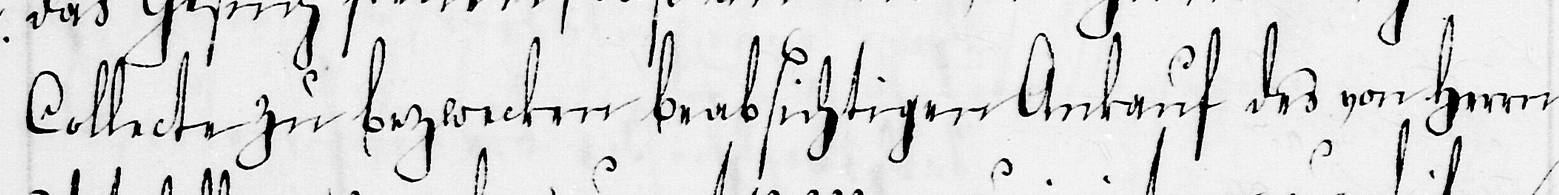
Collecte zu bezwecken beabsichtigen Ankauf des von Herrn
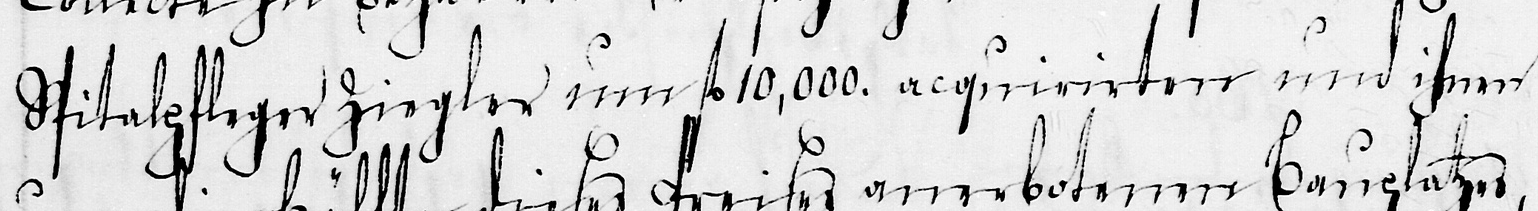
Spitalpfleger Ziegler um fl. 10,000. acquirirten und ihnen
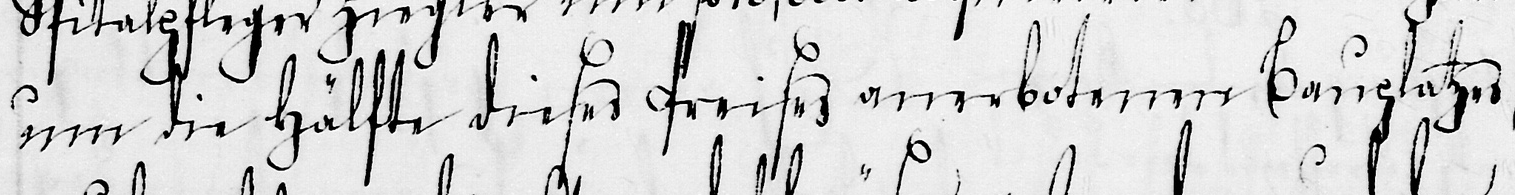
um die Hälfte dieses Preises anerbotenen Bauplatzes,
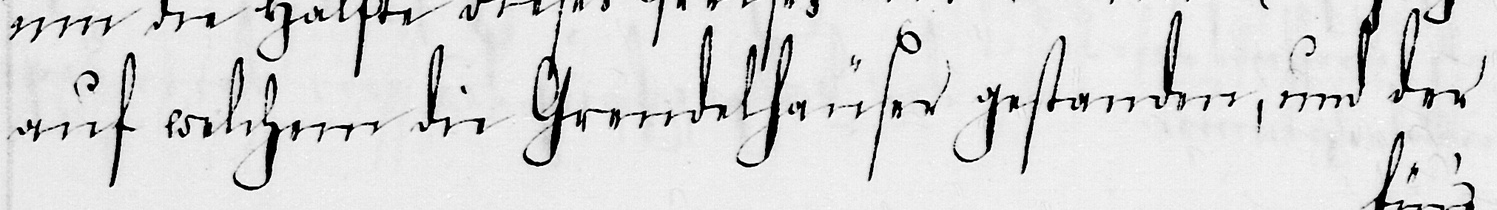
auf welchem die Grendelhäuser gestanden, und der
